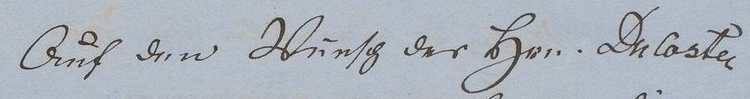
Auf den Wunsch des Hrn. Du Coster
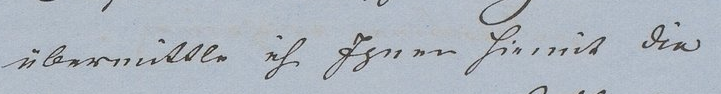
übermittle ich Ihnen hiemit die
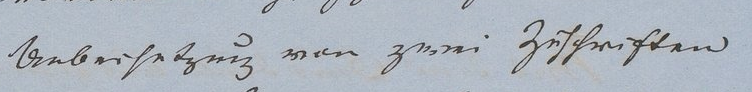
Uebersetzung von zwei Zuschriften
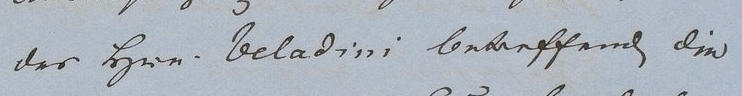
der Hrn. Veladini betreffend die
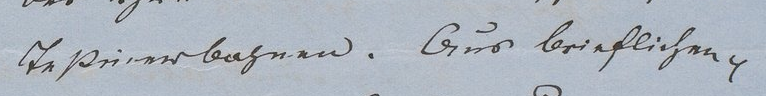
Teßinerbahnen. Aus brieflichen &
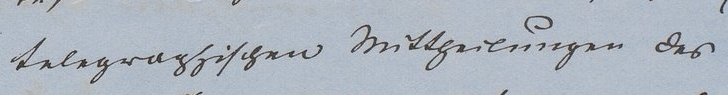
telegraphischen Mittheilungen des
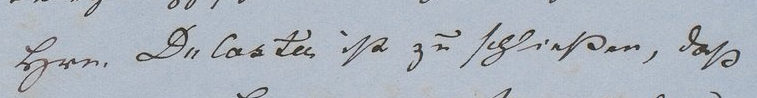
Hrn. Du Coster ist zu schließen, daß
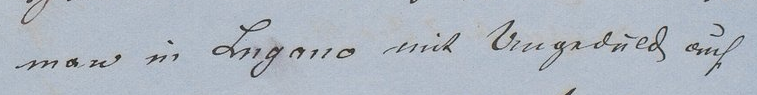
man in Lugano mit Ungeduld auf
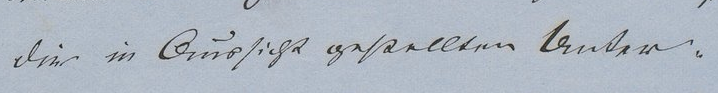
die in Aussicht gestellten Unter-
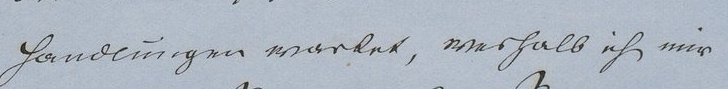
handlungen wartet, weshalb ich mir
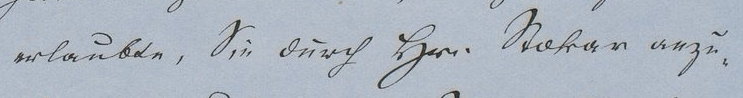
erlaubte, sie durch Hrn Stokar anzu-
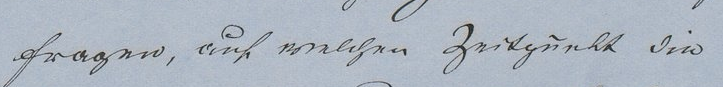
fragen, auf welchen Zeitpunkt die
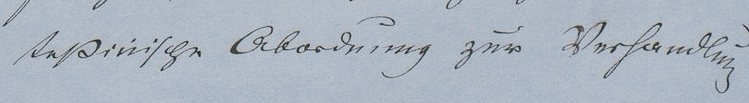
teßinische Abordnung zur Verhandlung
